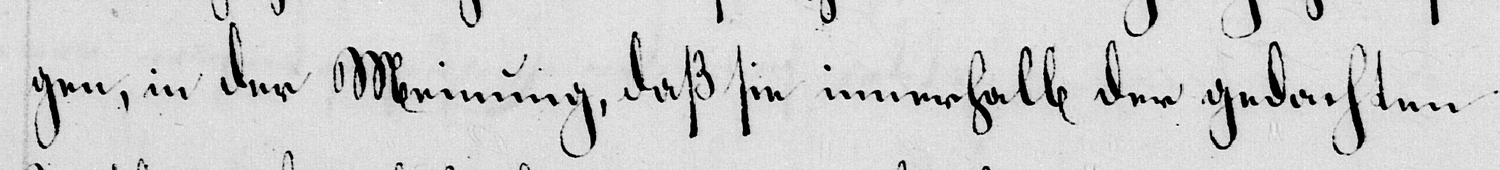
gen, in der Meinung, daß sie innerhalb der gedachten
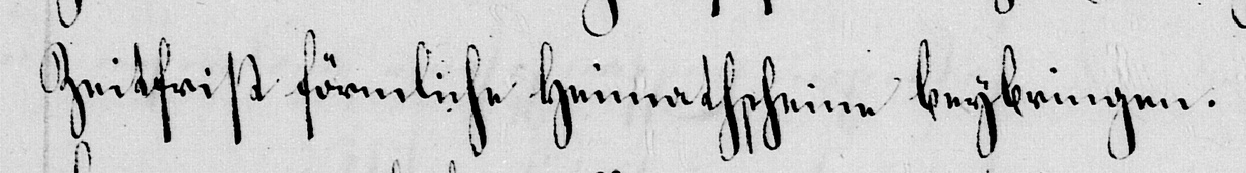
Zeitfrist förmliche Heimathschein beybringen.
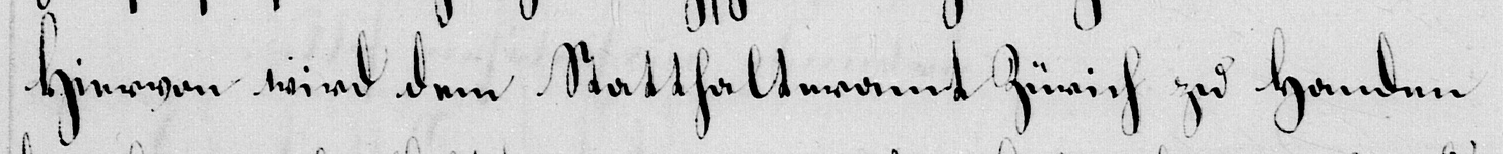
Hiervon wird dem Statthalteramt Zürich zu Handen
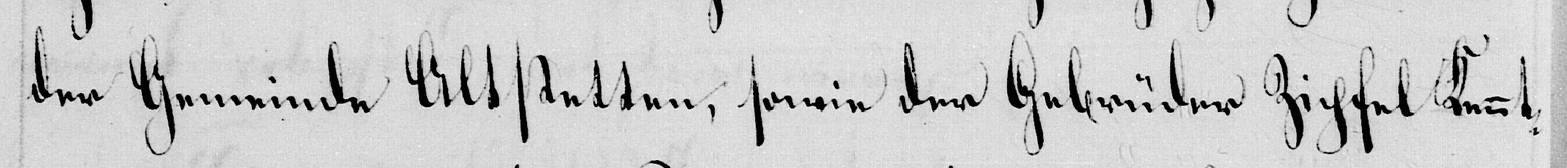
der Gemeinde Altstetten, sowie der Gebrüder Zipfel Kenn¬
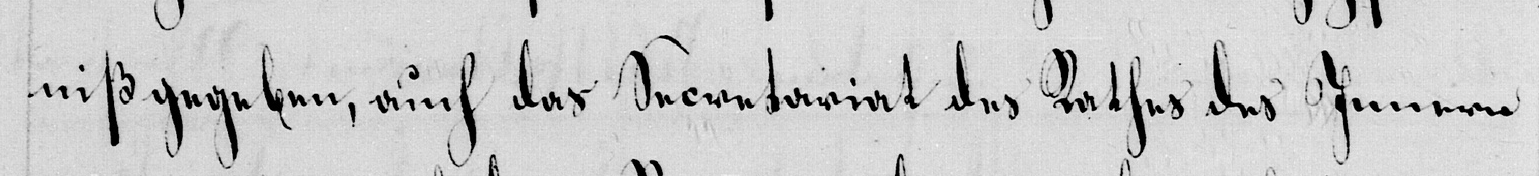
tniß gegeben, auch das Secretariat des Rathes des Innern
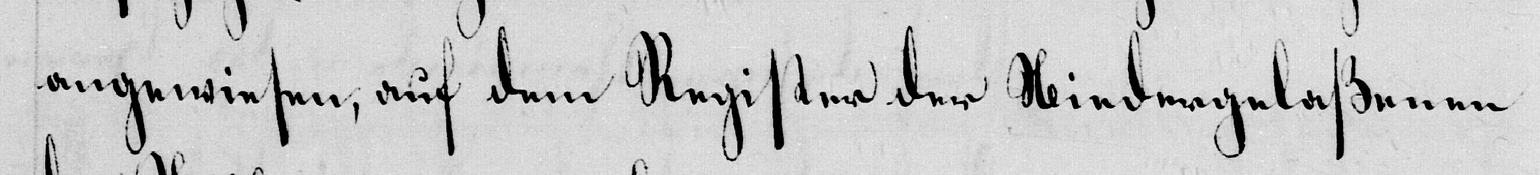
angewiesen, auf dem Register der Niedergelaßenen
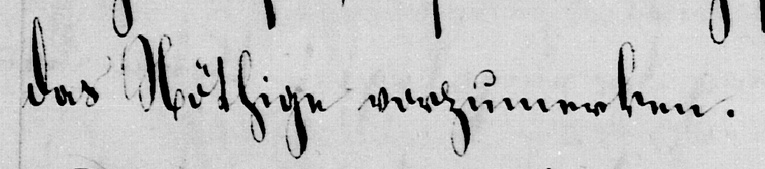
das Nöthige vorzumerken.
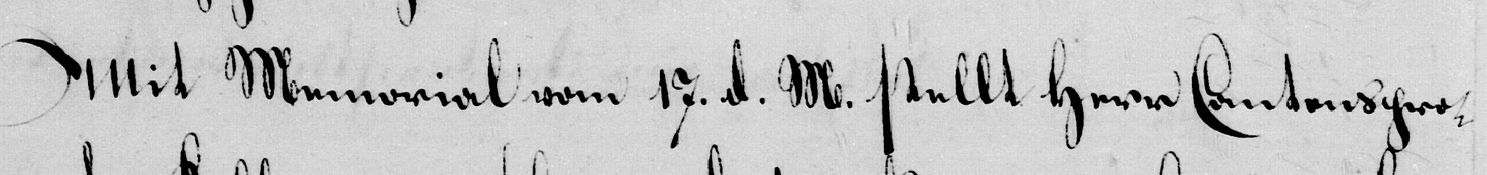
Mit Memorial vom 17. d. M. stellt Herr Cantonspro¬
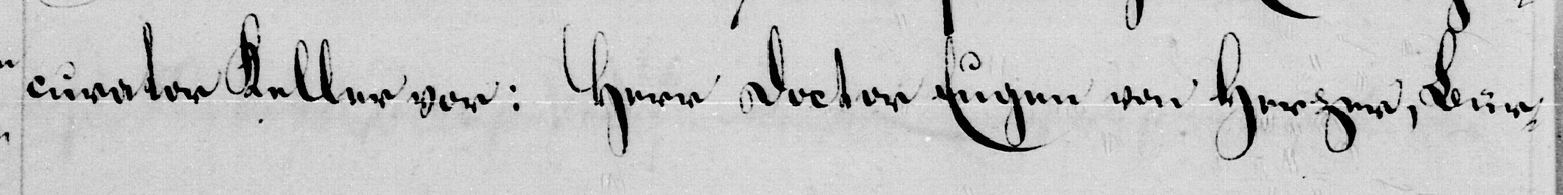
curator Keller vor: Herr Doctor Eugen Herzer, Bür-
